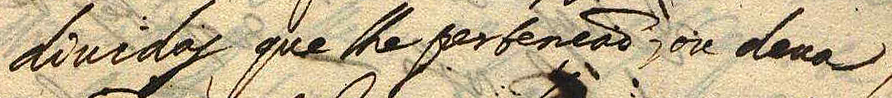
diuidas que lhe pertençaõ, ou deua,
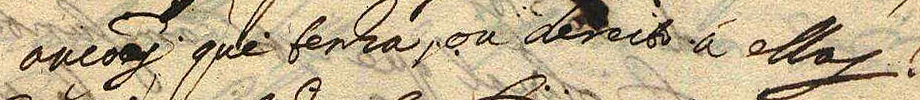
auções, que tenha, ou dereito á ellas?
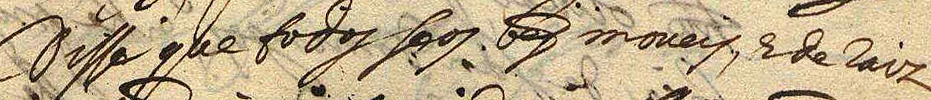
Disse que todos seos bēs moueis, E de Raiz
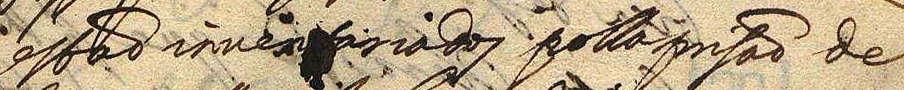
estaõ inuentariados polla prisaõ de
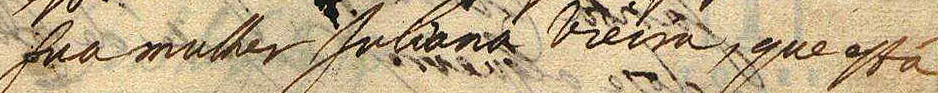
sua mulher Juliana Vieira, que está
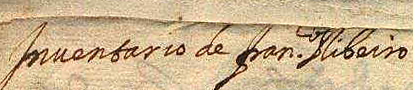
Jnuentario de fran.co Ribeiro
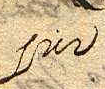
jur
